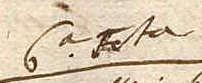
6.a Testa
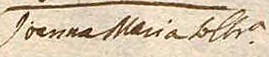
Joanna Maria soltr.a
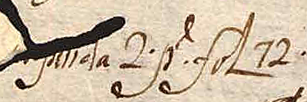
_nda 2. p.e foL 72.
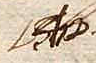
_
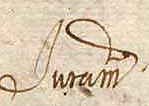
Juramto
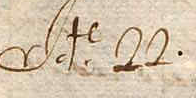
Id̄.e 22.
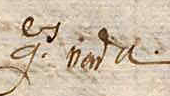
g.es nada.
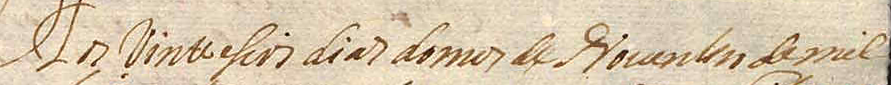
Aos Vinte e seis dias do mes de Nouembro de mil
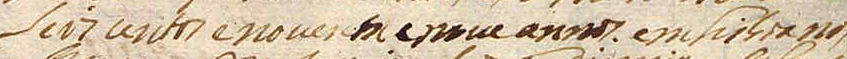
seiscentos e nouenta e noue annos. em Lisboa nos
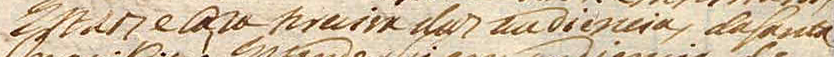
Estaos e caza terceira das audiencias da santa
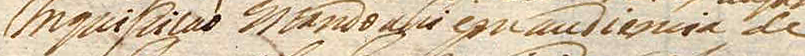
Inquisiçaõ Estando ahi em audiencia de
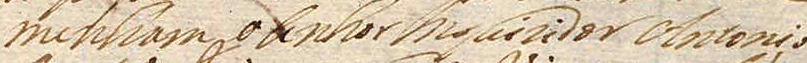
menham o Senhor Inquizidor Antonio
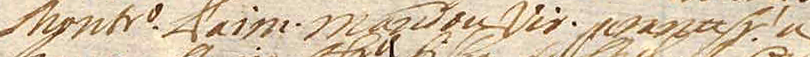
Montr.o Paim. mandou vir. perante sy. a
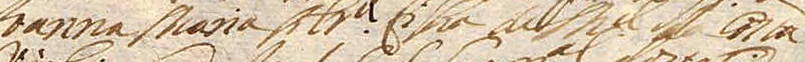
Joanna Maria soltr.a. filha de M.el da Costa
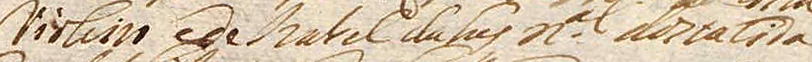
Violeiro e de Izabel da lus n.al desta cida
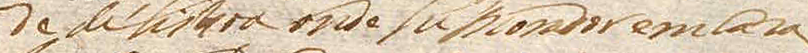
de de lisboa onde he morador em caza
